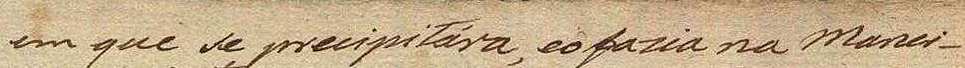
em que se precipitára e o fazia na manei
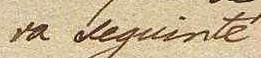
ra seguinte
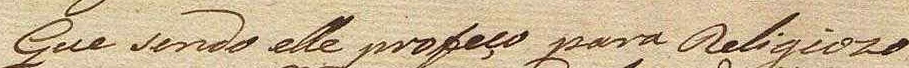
Que sendo elle profeço para Religiozo
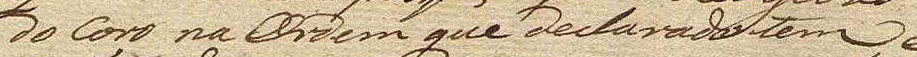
do coro na Ordem que declarado tem e
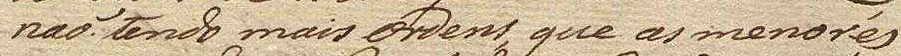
naõ tendo mais ordens que as menores
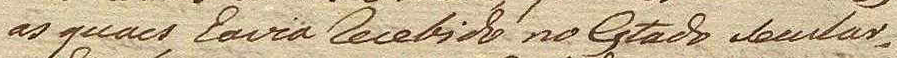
as quaes havia Recebido no Estado secular
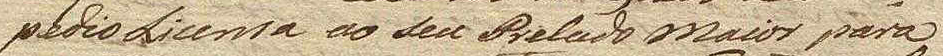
pedio Licensa ao seu Prelado maior para
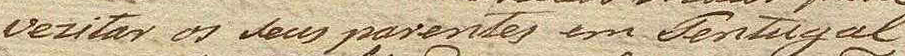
vezitar os seus parentes em Tentugal,
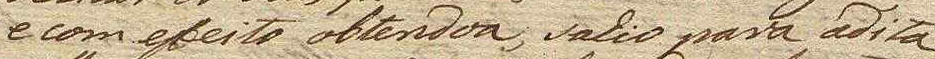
e com effeito obtendoa sahio para a dita
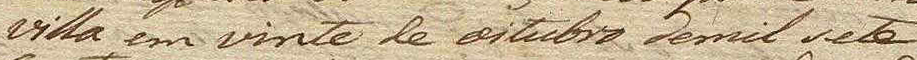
villa em vinte de oitubro de mil sete
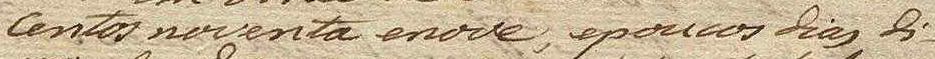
centos noventa e nove, e poucos dias di
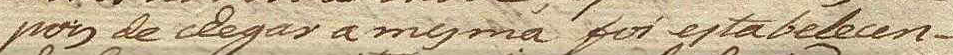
pois de chegar a mesma foi estabelecen
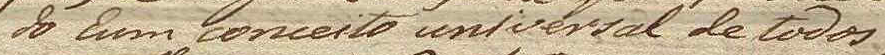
do hum conceito universal de todos
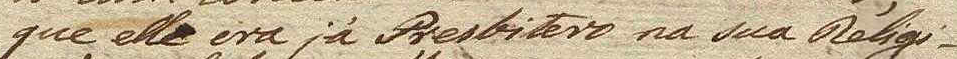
que elle era ja Presbitero na sua Religi
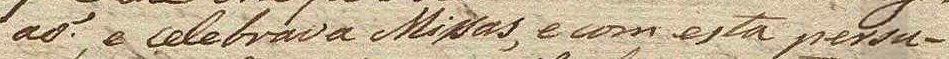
aõ e celebrava Missas, e com esta persu
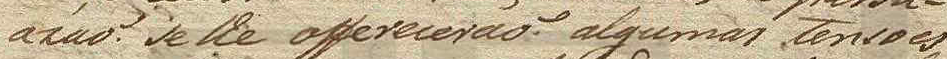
azaõ se lhe offereceraõ algumas tensoes
